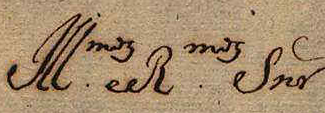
Ill.mos e R.mos Snr.es
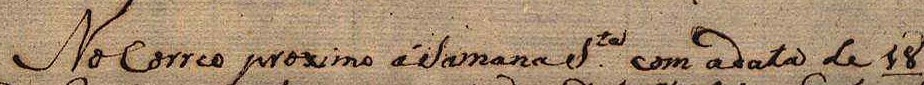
No Correo proximo á Samana S.ta com a data de 18
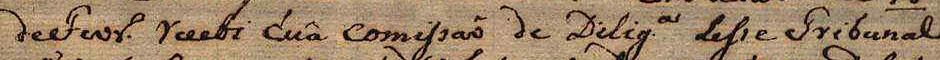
de Fevr.o recebi huā comissaõ de Dilig.as desse Tribunal
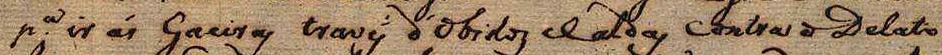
p.a ir ás Gaeiras través d'Obidos e Caldas contra o Delato
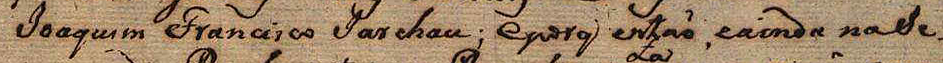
Ioaquim Francisco Iarchau; e porq̄ entaõ, e ainda na Se
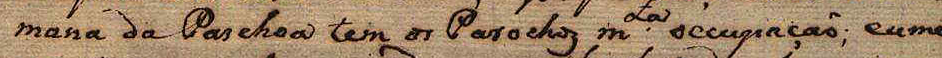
mana da Paschoa tem os Parochos m.ta occupaçaõ; eu me
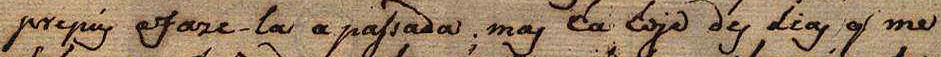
prepus a faze-la a passada; mas ha hoje des dias q̄ me
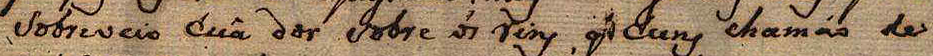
sobreveio huā dor sobre os rins, q̄ huns chamaõ de
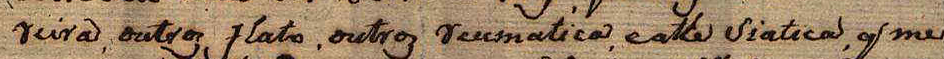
reira, outros flato outros reumatica, e athe siatica, q̄ me
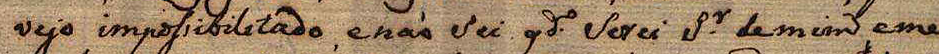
vejo impossibilitado, e naõ sei qd.o Serei S.r de mim e me
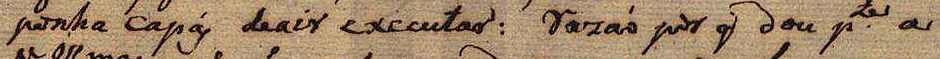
ponha capás de a ir executar: razaõ porq̄ dou p.te a
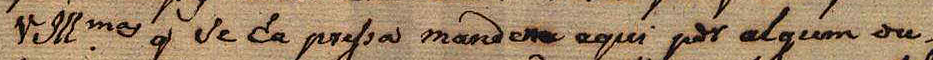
V Ill.mas q̄ se ha pressa mandem aqui por algum ou
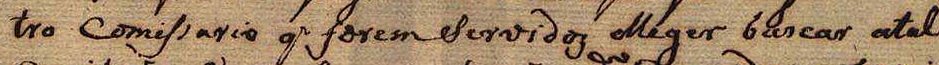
tro Comissario q̄ forem servidos elleger buscar a tal
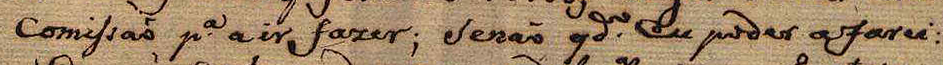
comissaõ p.a a ir fazer; senaõ qd.o Eu poder a farei:
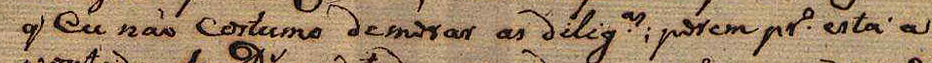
q̄ Eu naõ costumo demorar as dilig.as; porem pr.o está a
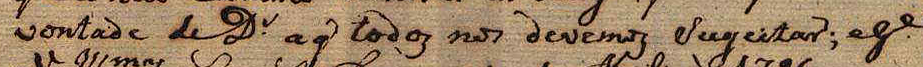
vontade de D.s a q̄ todos nos devemos sugeitar; e G.e
